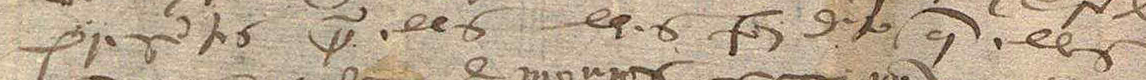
presētes p̄o elles lhes foi dito q̄ elles
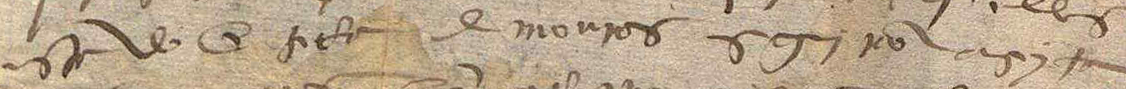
zēdo e fee de nouos segino asyta
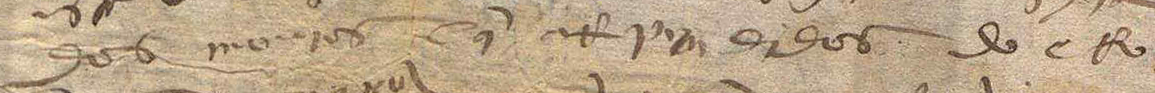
dos como a das do elle
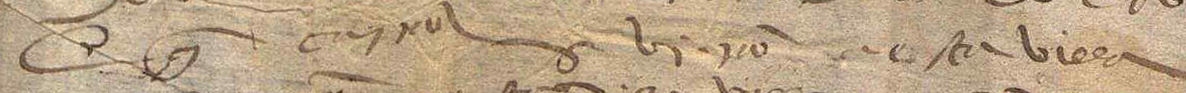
E caso se veyo nesta villa
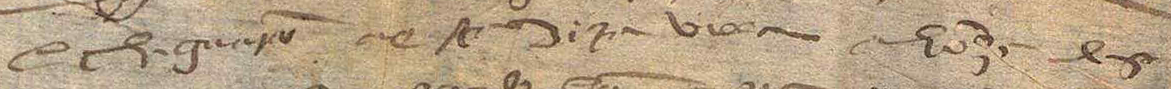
e cheguar a este dita villa e hoje des
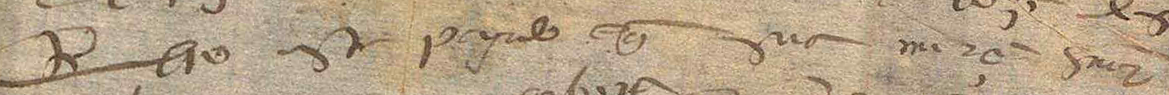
p̄o sendo q̄ sua mai da
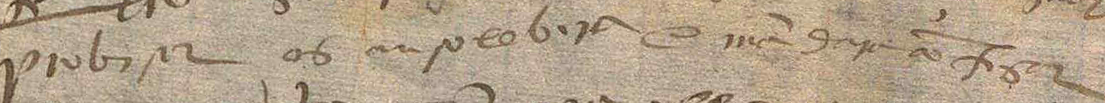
dezer as pobras no dito fes
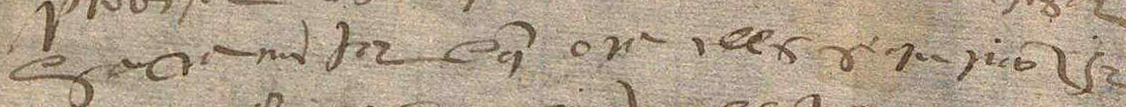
e sesemeter o q̄ ora elle seruyço de
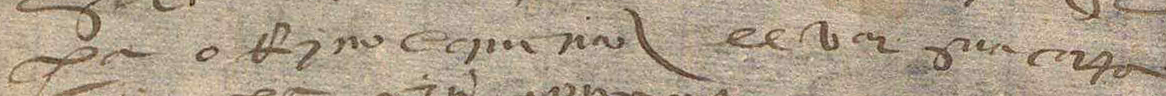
ꝑa o Reino quem elle par sua certa
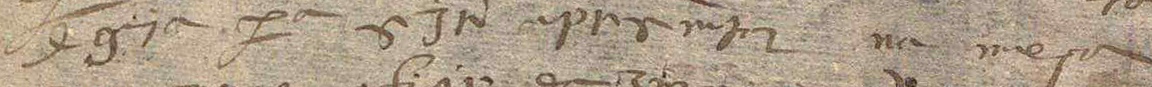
pera ha seu apresentar na mesa
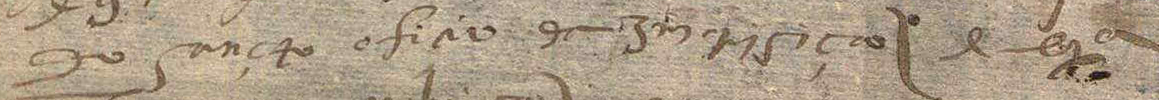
do sancto officio de quisiçaõ de lxa
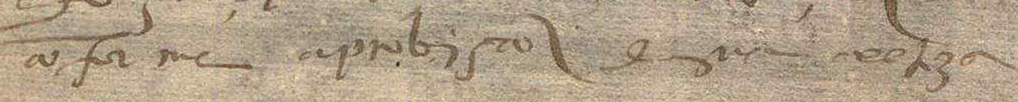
c̄oforme aprovysão de sua alteza
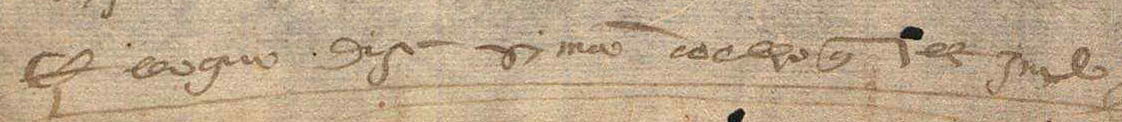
he loguo dise primo coelho q̄ he tudo
